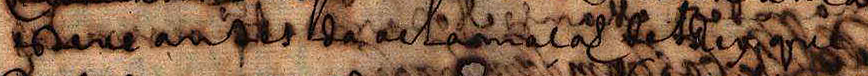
esteue antes da aclamaçaõ del Rey que
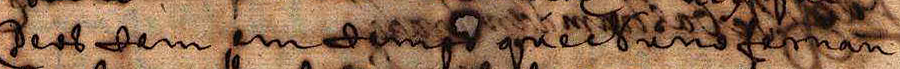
Deos tem em tempo que Nuno fernan
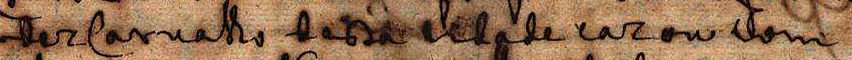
dez Carualho desta cidade cazou com
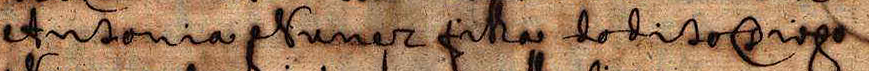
Antonia Nunez filha do dito Diogo
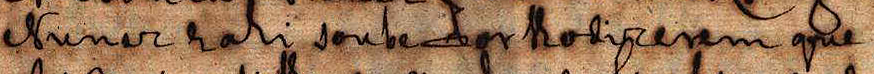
Nunez E ahi soube por lho dizerem que
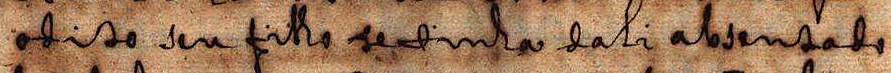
o dito seu filho se tinha dali absentado
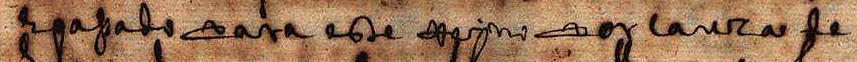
E passado para este Rejno por cauza de
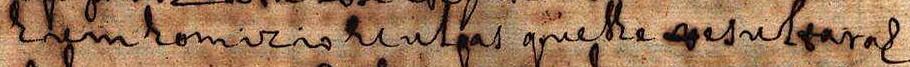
hum homizio E culpas que lhe Resultaraõ
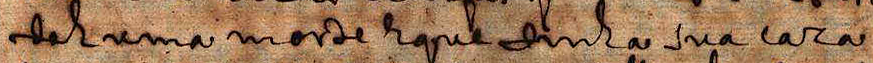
de huma morte E que tinha sua caza
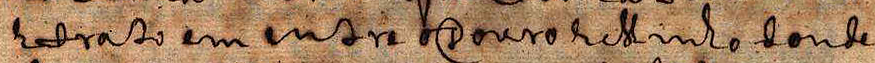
E trato em entre o Douro E Minho donde
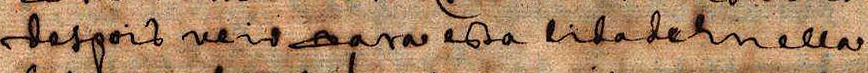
despois ueio para esta cidade E nella
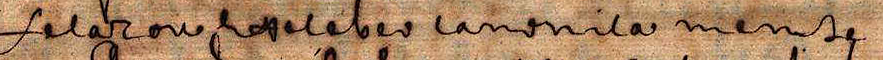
se cazou E Recebeo canonicamente
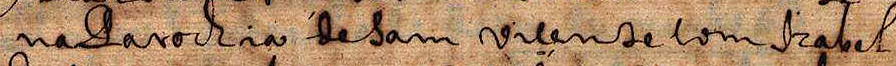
na Parochia de sam Vicente com Izabel
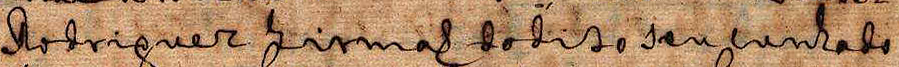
Rodriguez hirmā do dito seu cunhado
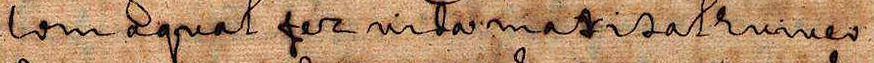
com a qual fez vida marital E uiueo
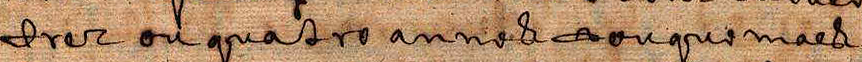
trez ou quatro annos pouquo mais
